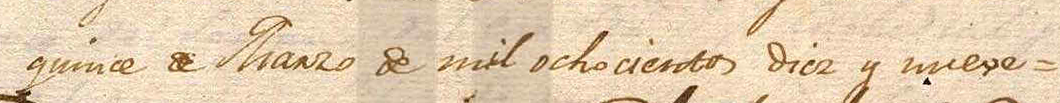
quince de Marzo de mil ochocientos diez y nueve
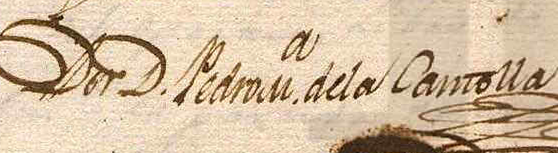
Dor D. Pedro M.a dela Cantolla
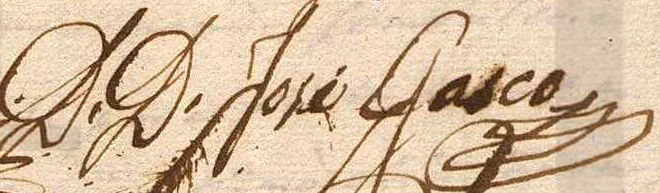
D. D. José Gasco
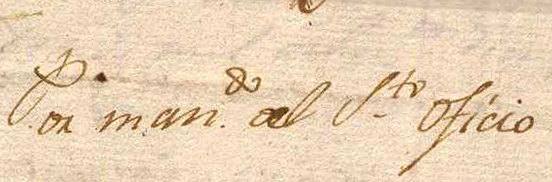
Por man.do del S.to oficio
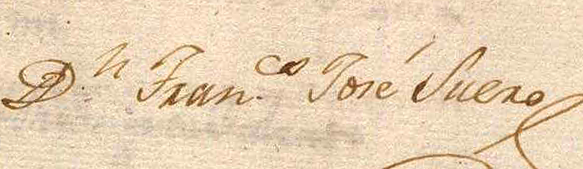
D.n Fran.co Iozé Suero
